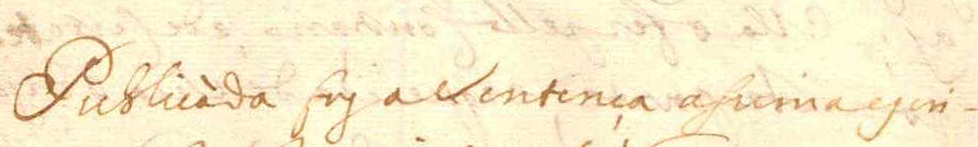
Publicàda foy a Sentença assima escri
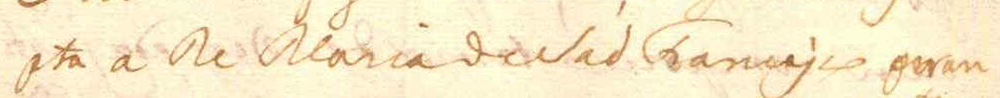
pta a Re Maria de Saõ Francisco peran
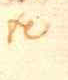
te
